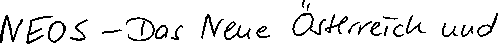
NEOS – Das Neue Österreich und
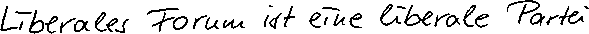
Liberales Forum ist eine liberale Partei
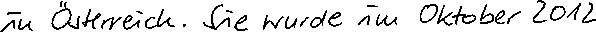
in Österreich. Sie wurde im Oktober 2012
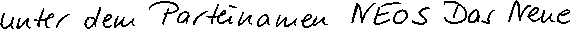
unter dem Parteinamen NEOS Das Neue
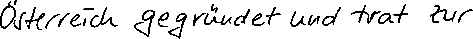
Österreich gegründet und trat zur
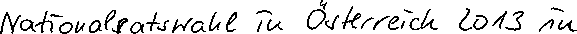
Nationalratswahl in Österreich 2013 in
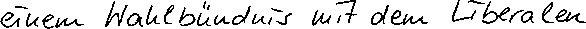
einem Wahlbündnis mit dem Liberalen
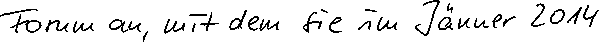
Forum an, mit dem sie im Jänner 2014
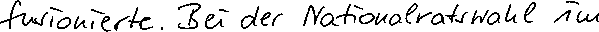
fusionierte. Bei der Nationalratswahl im
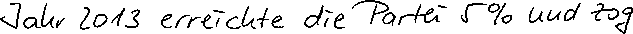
Jahr 2013 erreichte die Partei 5 % und zog
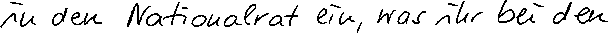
in den Nationalrat ein, was ihr bei den
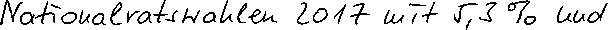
Nationalratswahlen 2017 mit 5,3 % und
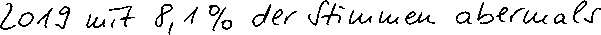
2019 mit 8,1 % der Stimmen abermals
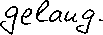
gelang.
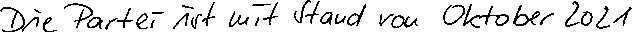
Die Partei ist mit Stand von Oktober 2021
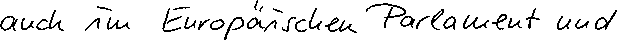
auch im Europäischen Parlament und
